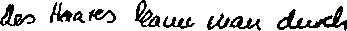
des Haares kann man durch
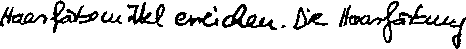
Haarfärbemittel erreichen. Die Haarfärbung
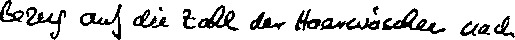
Bezug auf die Zahl der Haarwäschen nach
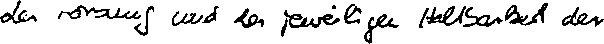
der Färbung und der jeweiligen Haltbarkeit der
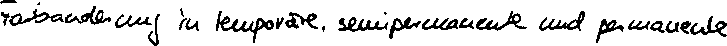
Farbänderung in temporäre, semipermanente und permanente
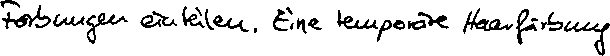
Färbungen einteilen. Eine temporäre Haarfärbung
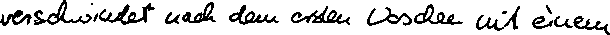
Verschwindet nach dem ersten Waschen mit einem
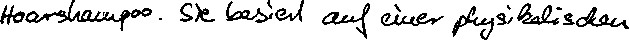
Haarshampoo. Sie basiert auf einer physikalischen
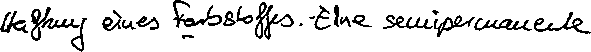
Haftung eines Farbstoffes. Eine semipermanente
